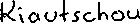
Kiautschou
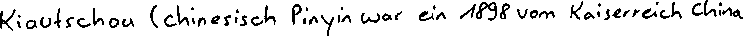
Kiautschou (chinesisch Pinyin war ein 1898 vom Kaiserreich China
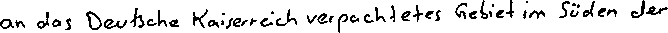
an das Deutsche Kaiserreich verpachtetes Gebiet im Süden der
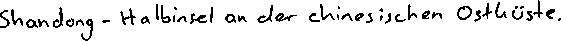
Shandong-Halbinsel an der chinesischen Ostküste.
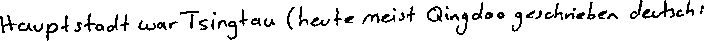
Hauptstadt war Tsingtau (heute meist Qingdao geschrieben deutsch:
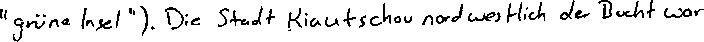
"grüne Insel"). Die Stadt Kiautschou nordwestlich der Bucht war
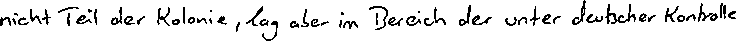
nicht Teil der Kolonie, lag aber im Bereich der unter deutscher Kontrolle
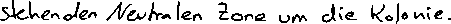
stehenden Neutralen Zone um die Kolonie.
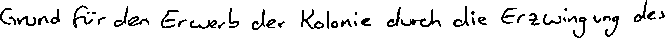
Grund für den Erwerb der Kolonie durch die Erzwingung des
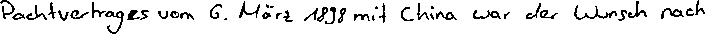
Pachtvertrages vom 6. März 1898 mit China war der Wunsch nach
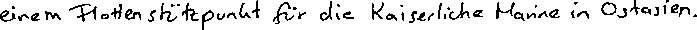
einem Flottenstützpunkt für die Kaiserliche Marine in Ostasien
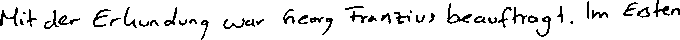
Mit der Erkundung war Georg Franzius beauftragt. Im Ersten
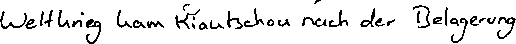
Weltkrieg kam Kiautschou nach der Belagerung
